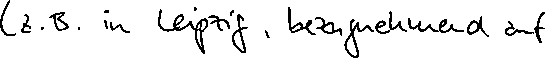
(z. B. in Leipzig, bezugnehmend auf
